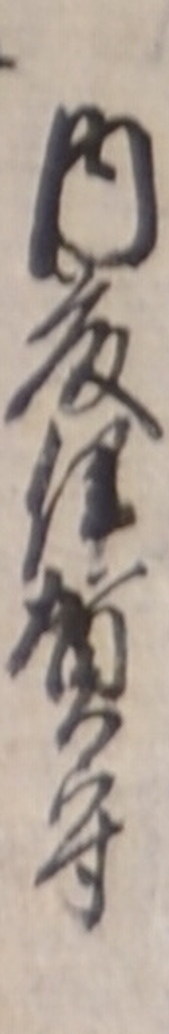内藤伊賀守
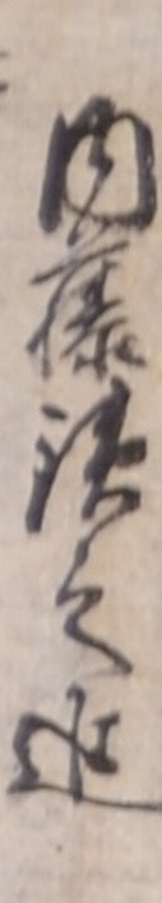内藤鉄之進
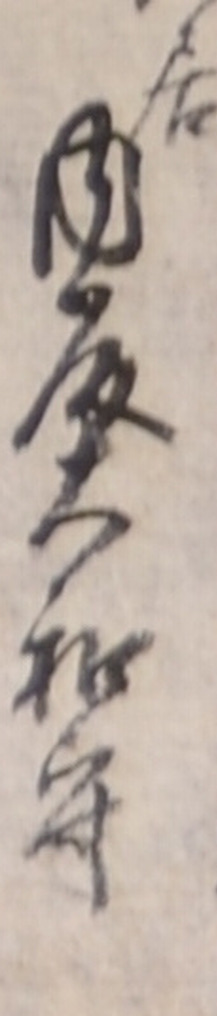内藤大和守
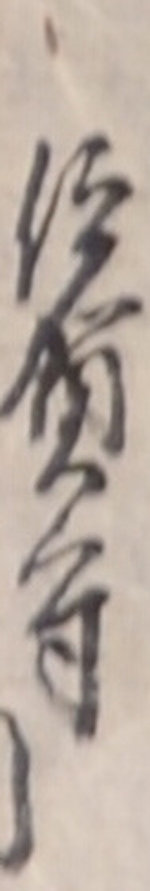伊賀守
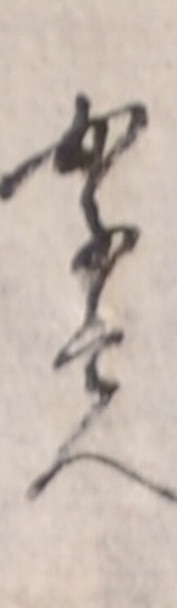女子壱人
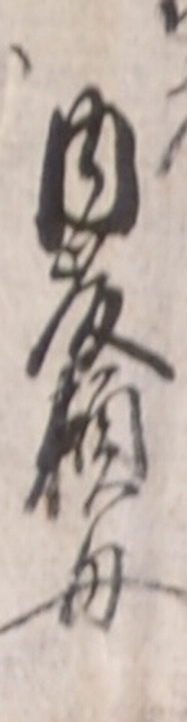内藤頼母
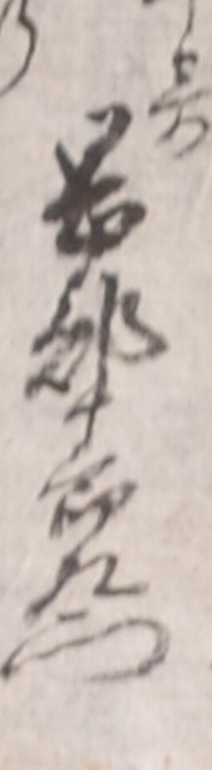岡部十郎左衛門
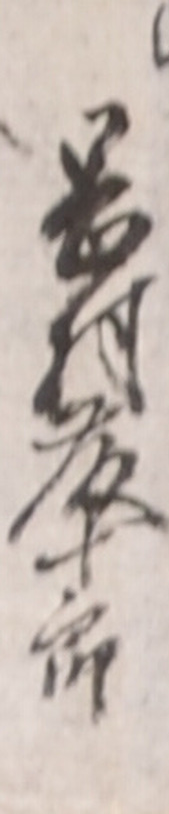岡村藤十郎
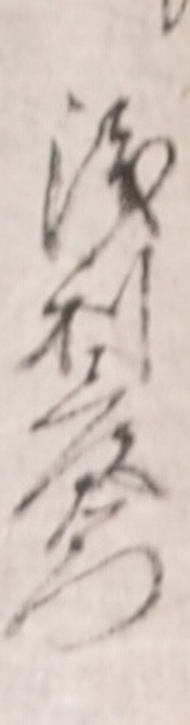浅利彦右衛門
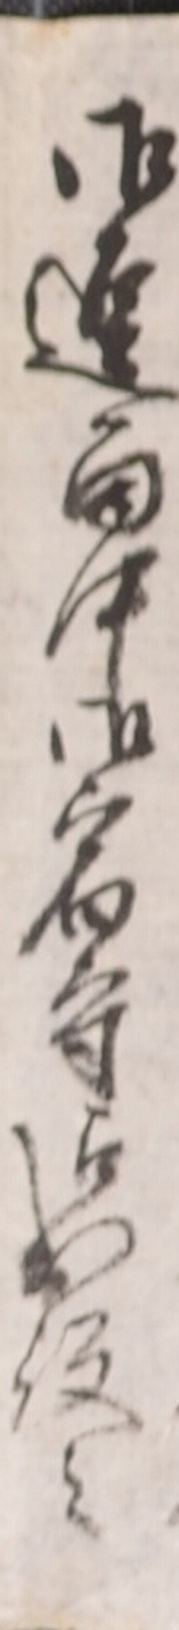御逗留中御宿寺江出役之
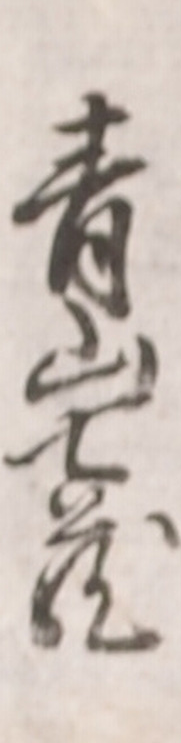青山七蔵
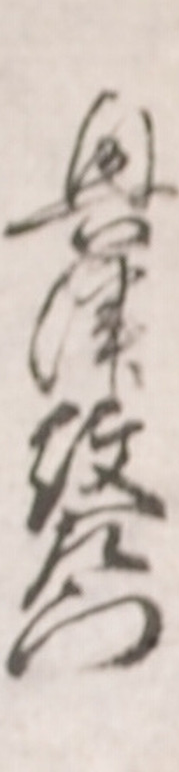奥津紋左衛門
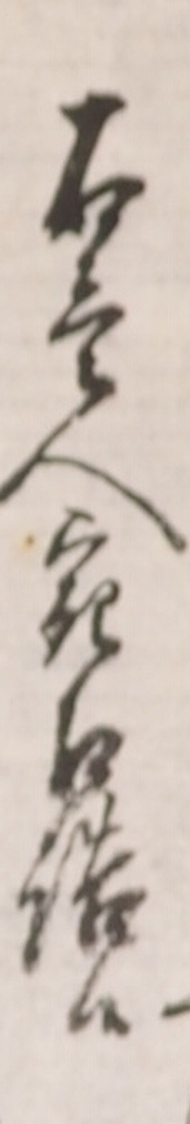右壱人宛相詰候
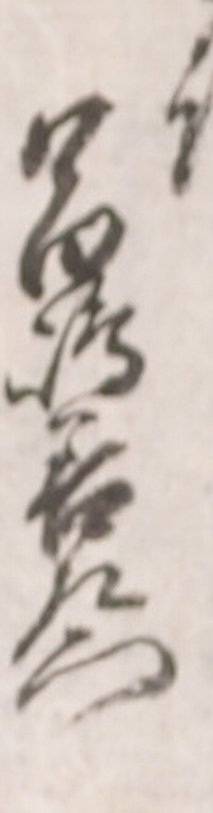冨嶋善左衛門
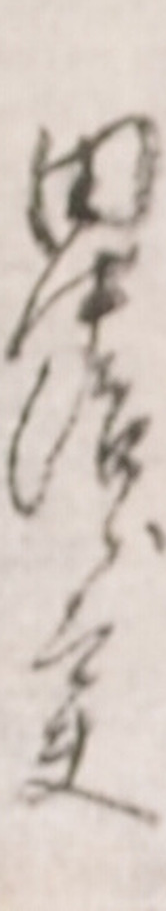田中治郎太夫
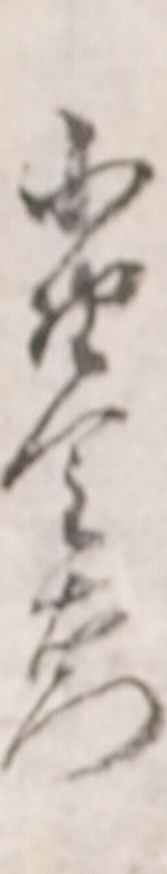小野金右衛門
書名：（覚）
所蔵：伊那市立高遠町図書館・合同会社AMANE
